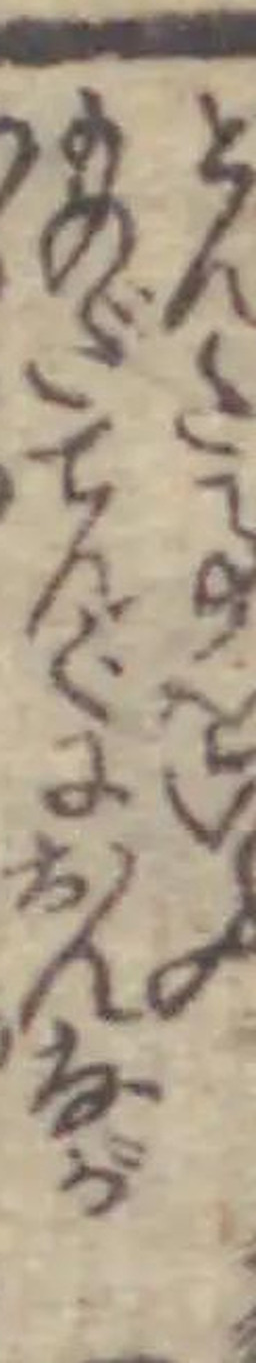ものだてんぐにおんなが
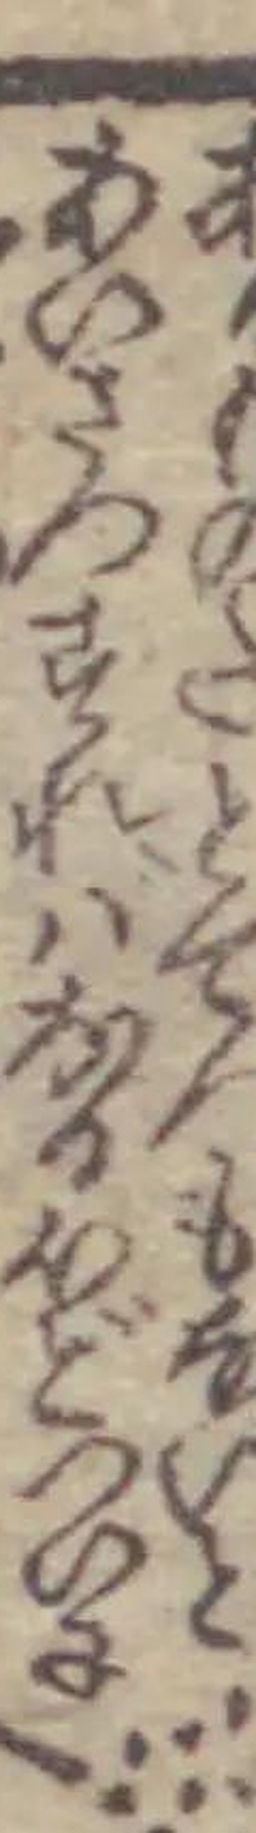あいさつすればなるほどついに
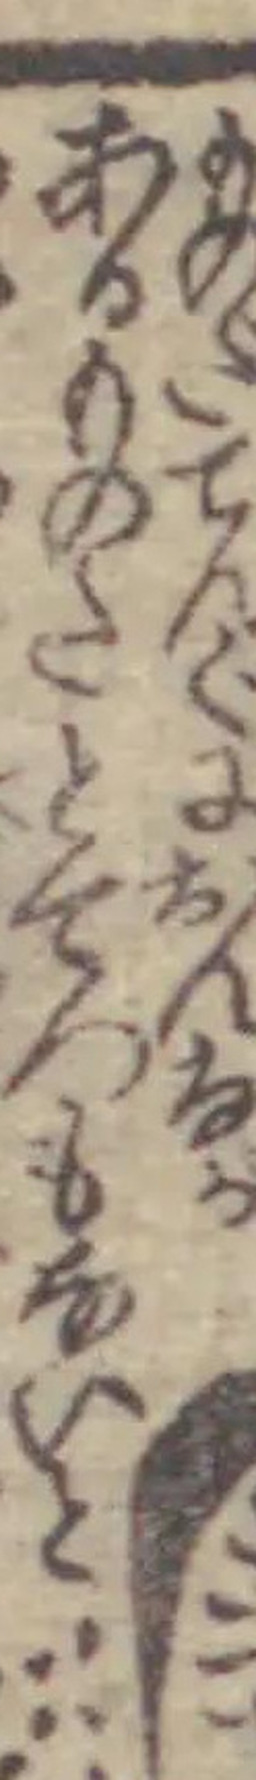あるものたとてつもないと
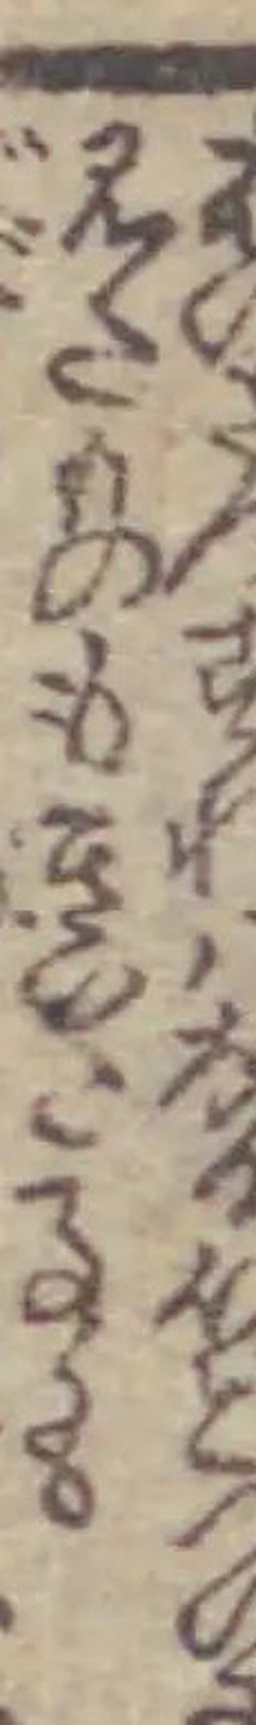見たものもきいた事も
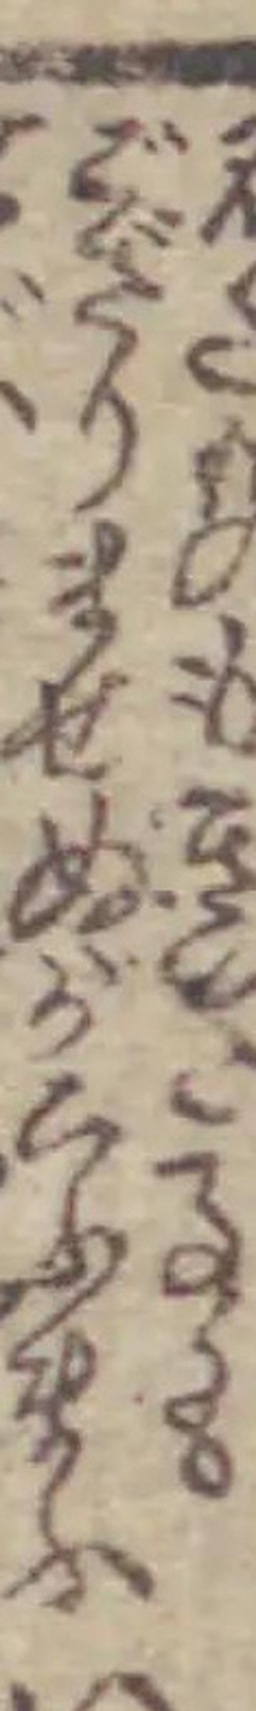ござりませぬがこうまふ
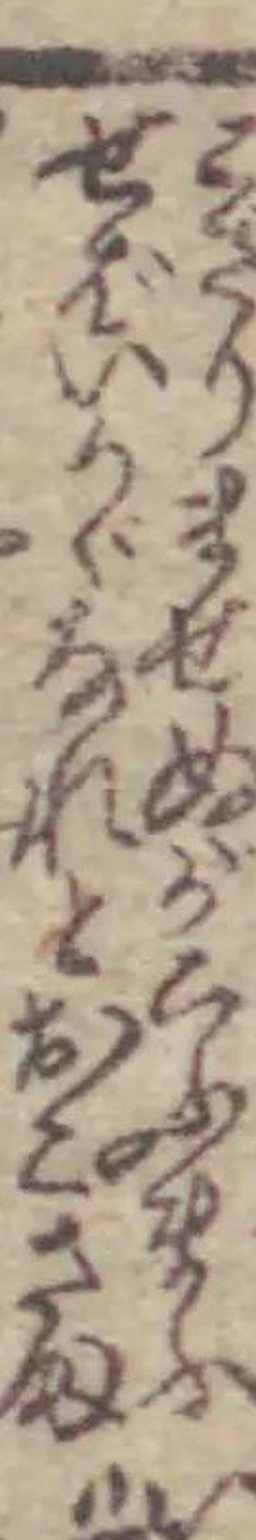せばいかゞなれとおこさま
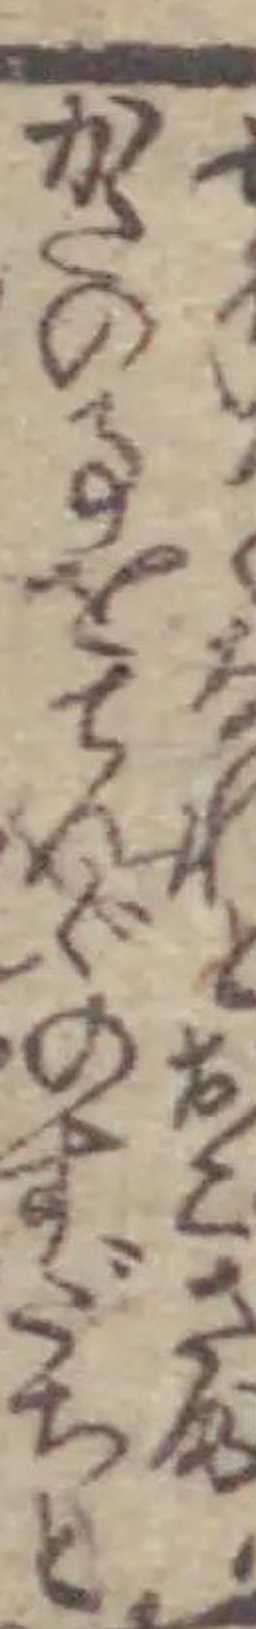かたの事をてんぐのすだちと
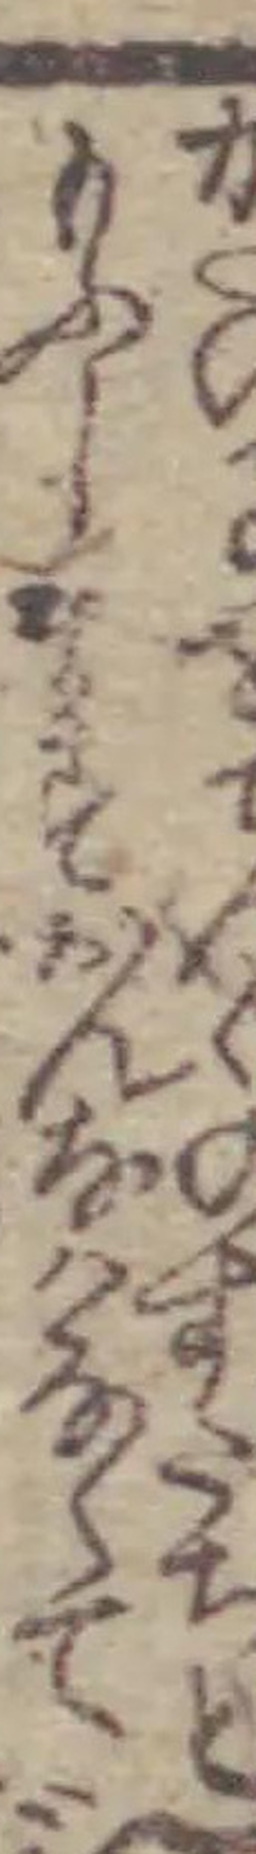もふしますおんなはなくて
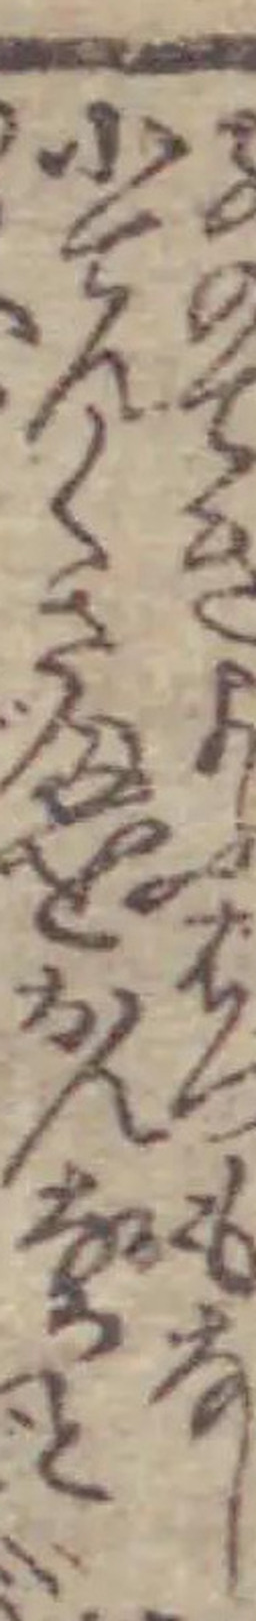小てんくさまをおんなかと
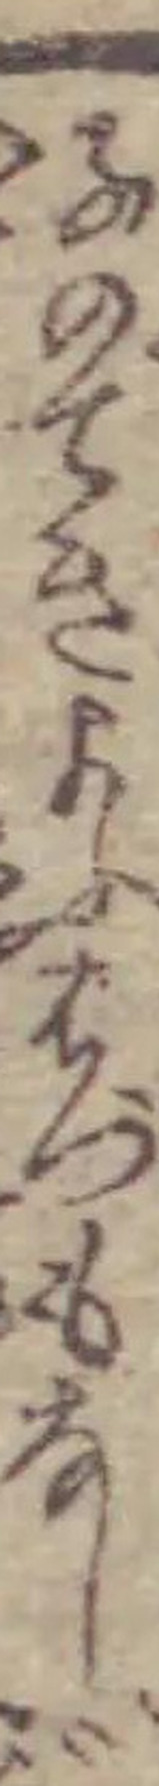子のてきよふはづもなし
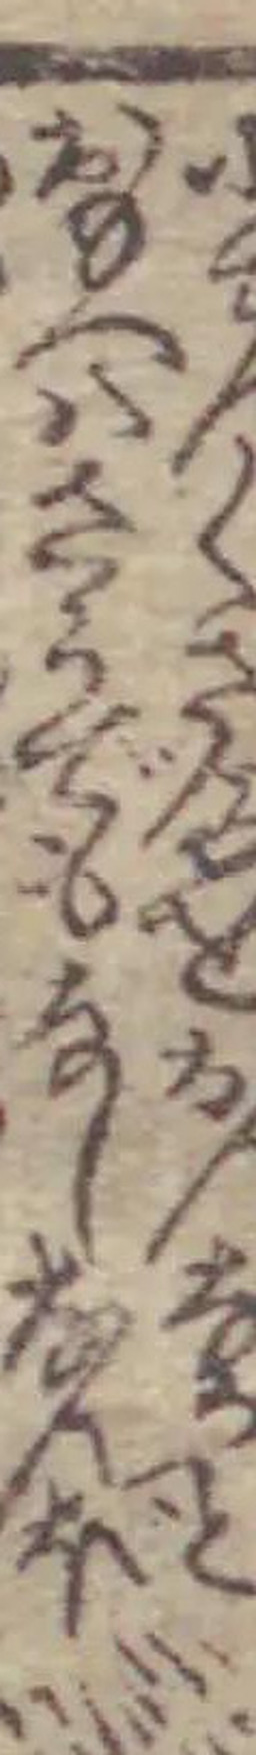おもへはさうでもなしなんぼ
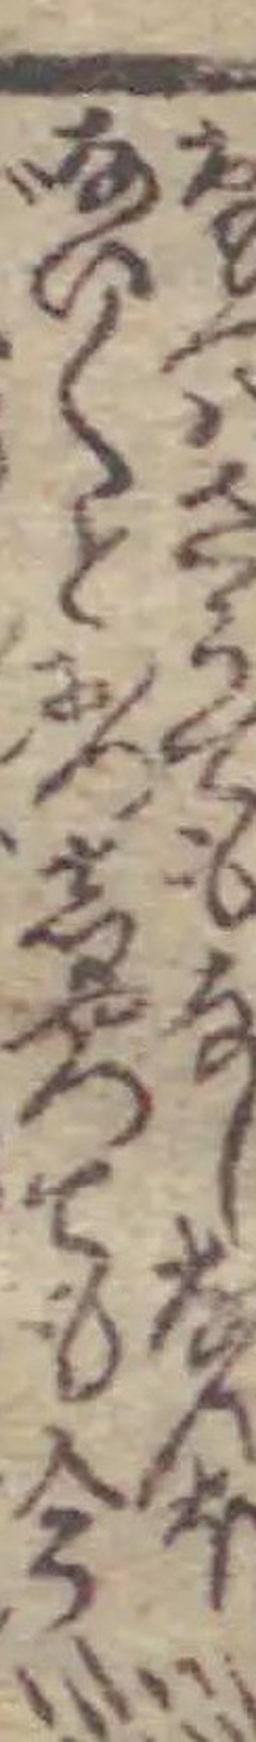ない〳〵とおつしやつても今
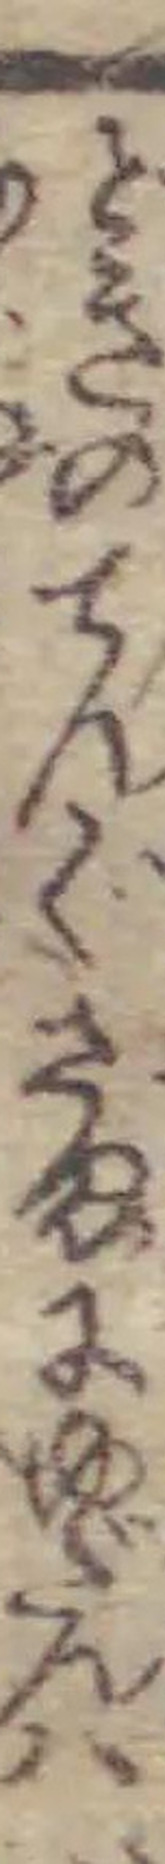どきのてんぐさまにゆだんは
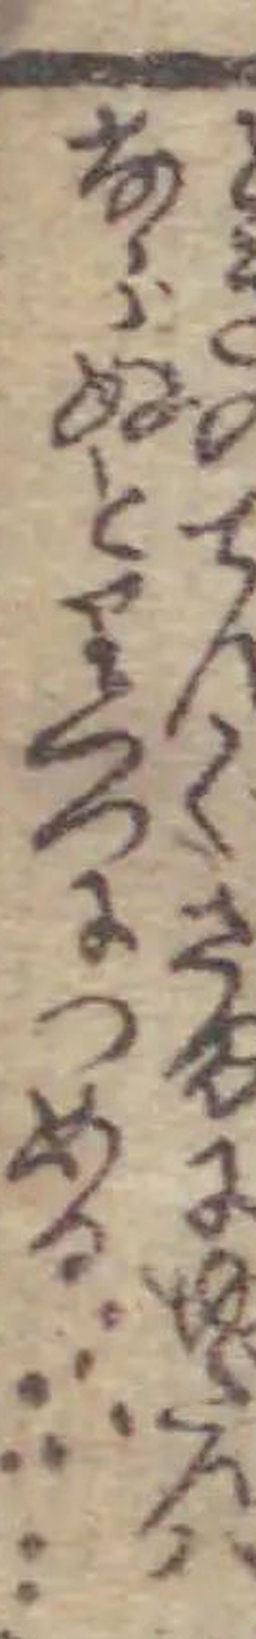ならぬとりくつにつめる

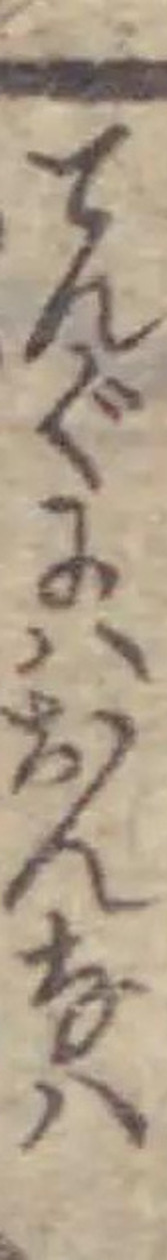てんぐにはおんなは
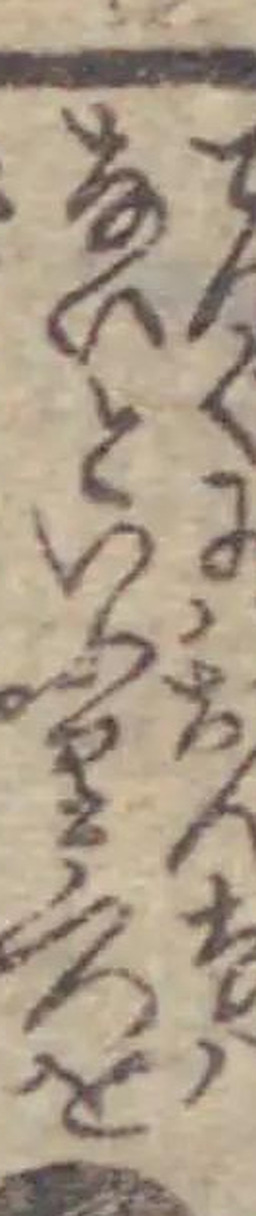ないといふりくつを
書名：珍説女天狗 2巻
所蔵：国立国会図書館 National Diet Library, JAPAN
